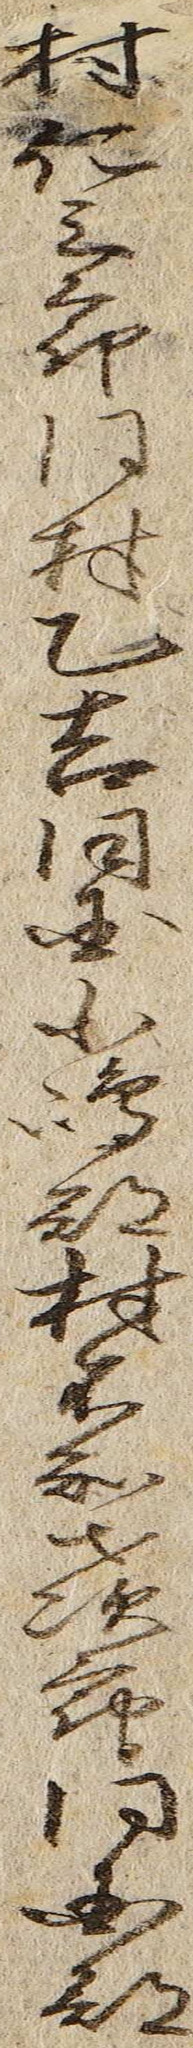村仁三郎同村乙吉同国小島郡村不知才次郎同国郡
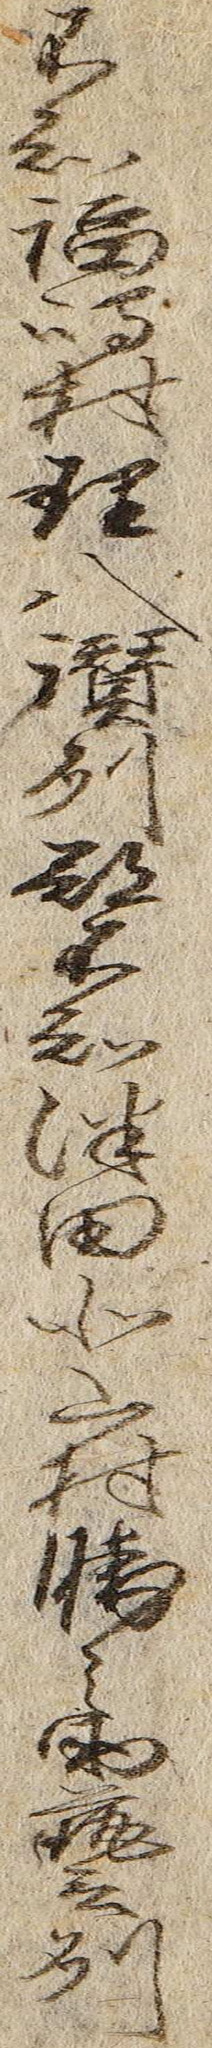不知福島村理八讃州郡不知伴田北山村勝之助芸州
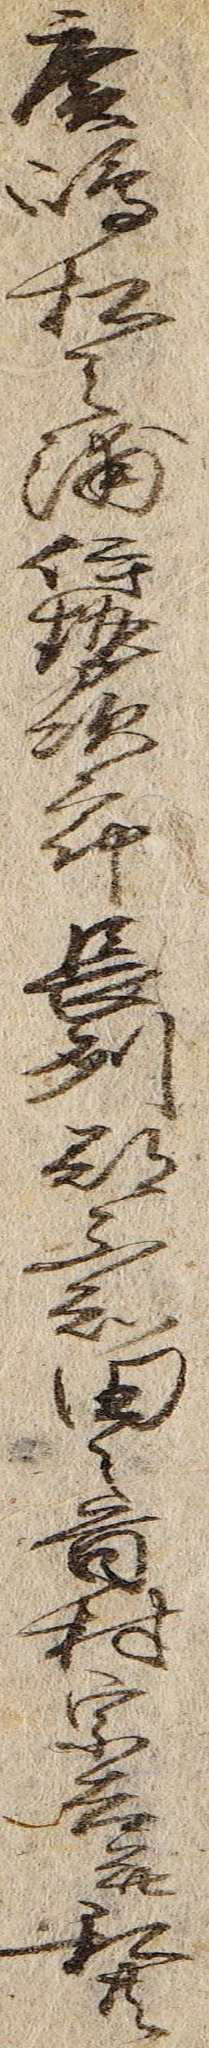広島松之浦伊勢次郎長州郡不知田之首村宗吉并私共
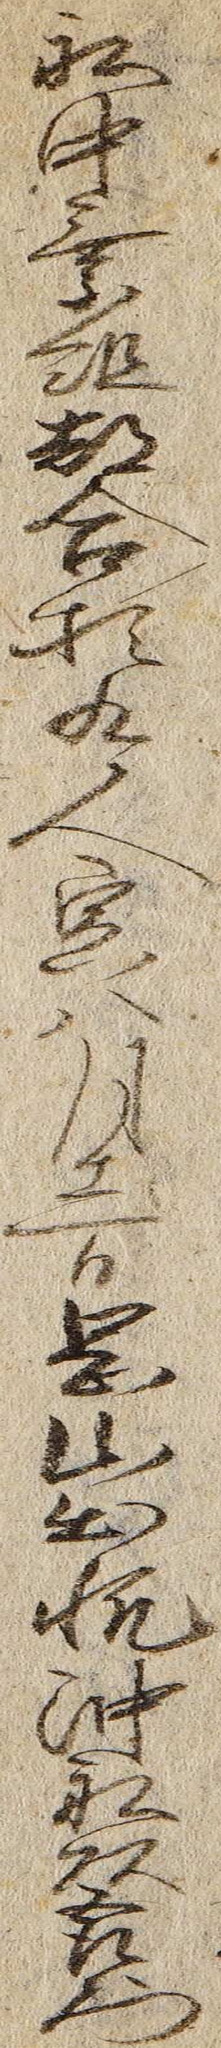船中乗組都合十九人寅八月十二日岡山出帆沖船頭五左衛門
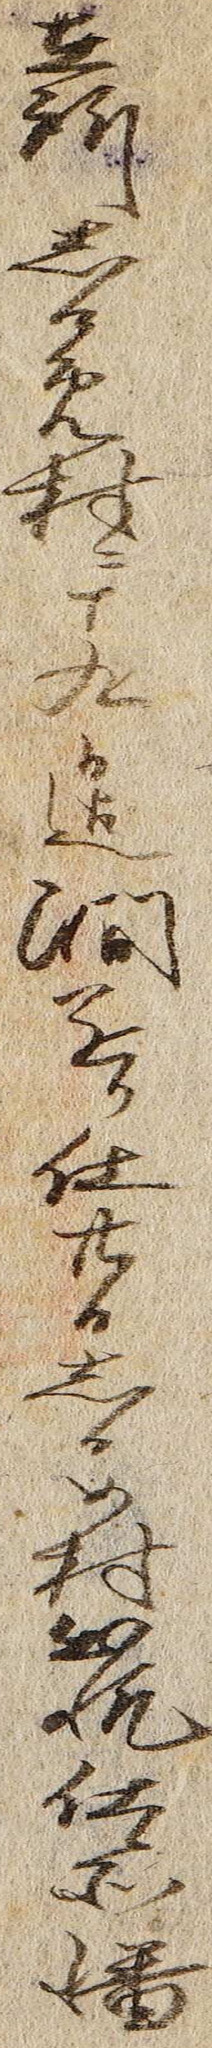在所しるめ村に十九日まで澗懸り仕二十日しるめ村出帆仕候所播
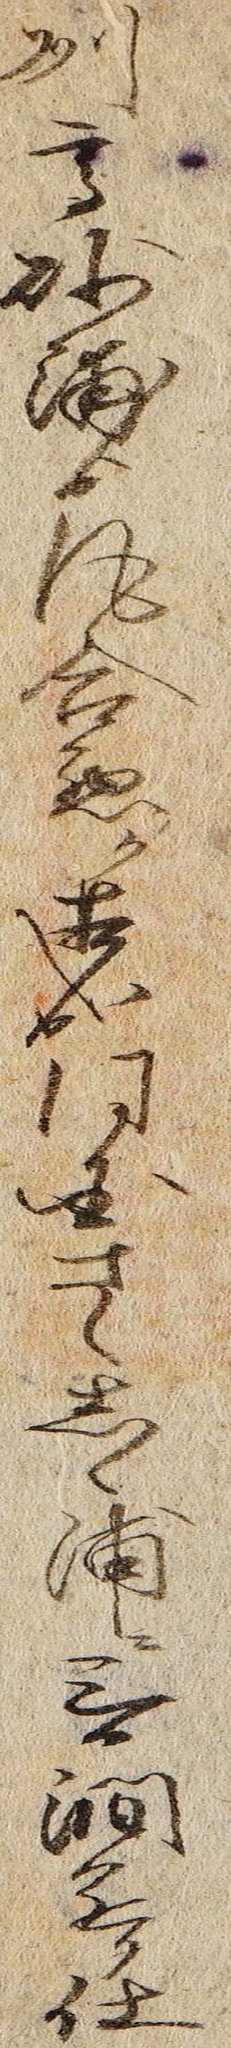州高砂浦より風合悪ク相成同国さく？しゝ浦に三日澗懸り仕
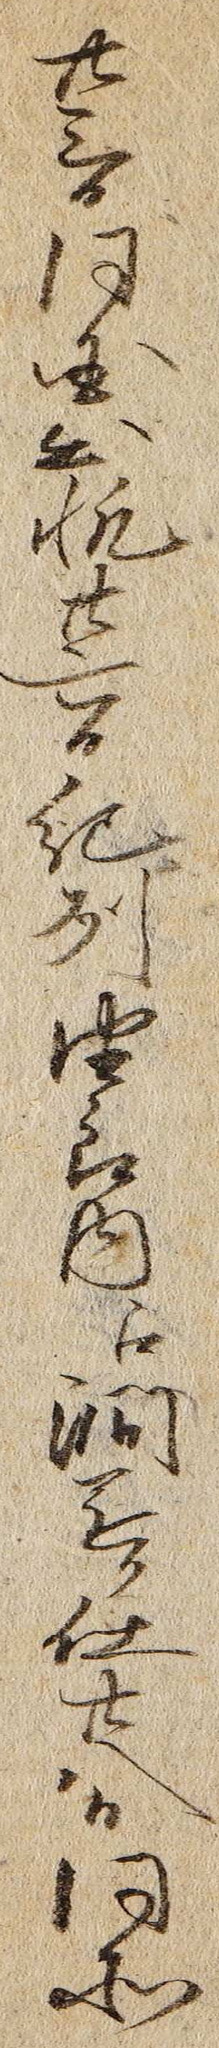二十三日同国出帆二十六日紀州由良内へ澗懸り仕二十八日同所
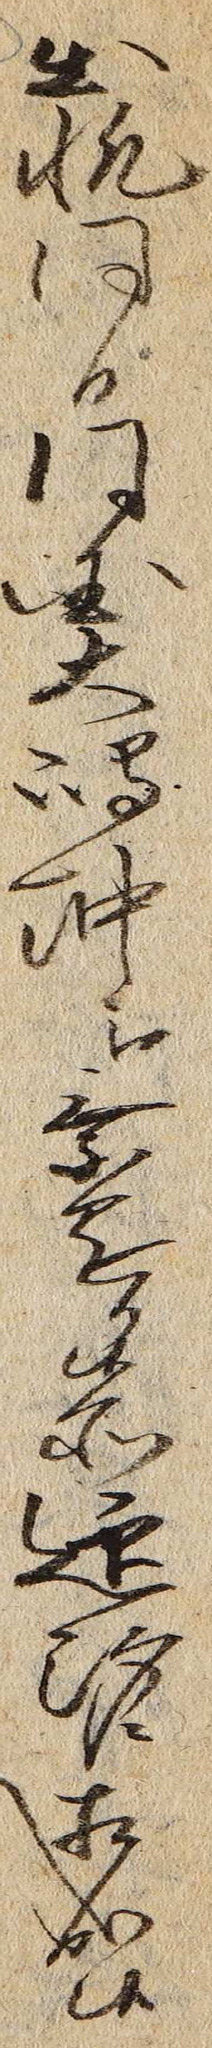出帆同日同国大島沖へ乗懸候所迎汐に相成候
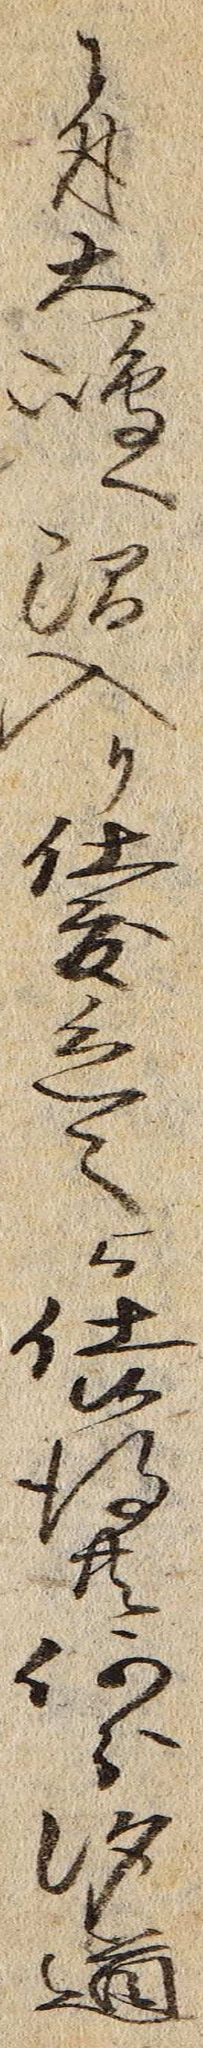に付大島へ澗入り仕度色々と仕候得ども何分汐道
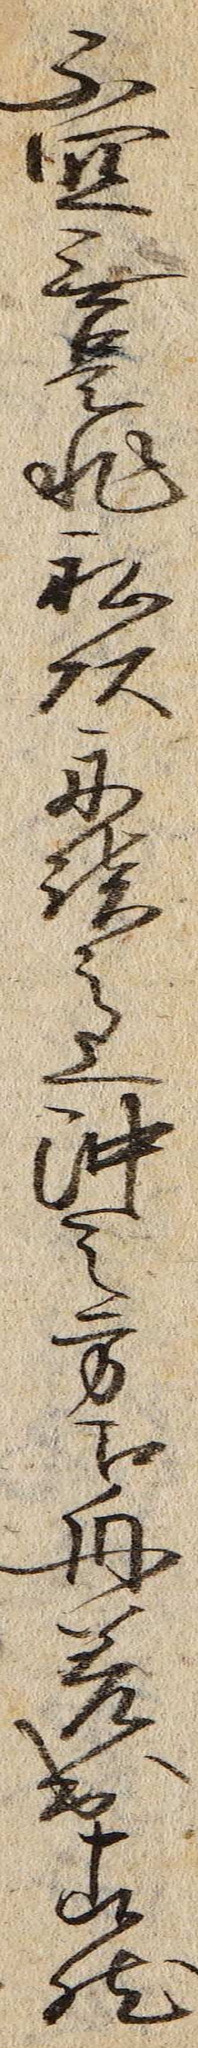不宜無是非船頭舟談の上沖の方へ舟差出申候然
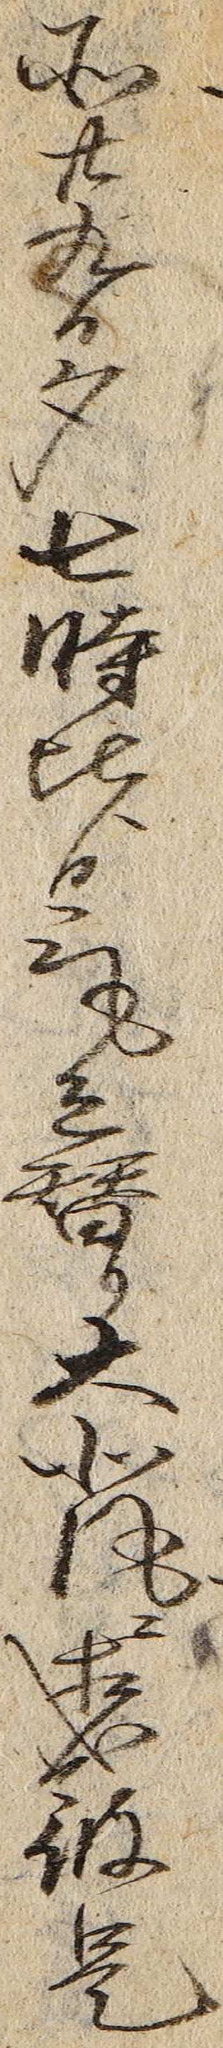所二十九日夕七時頃より気色替り大北風に相成彼是
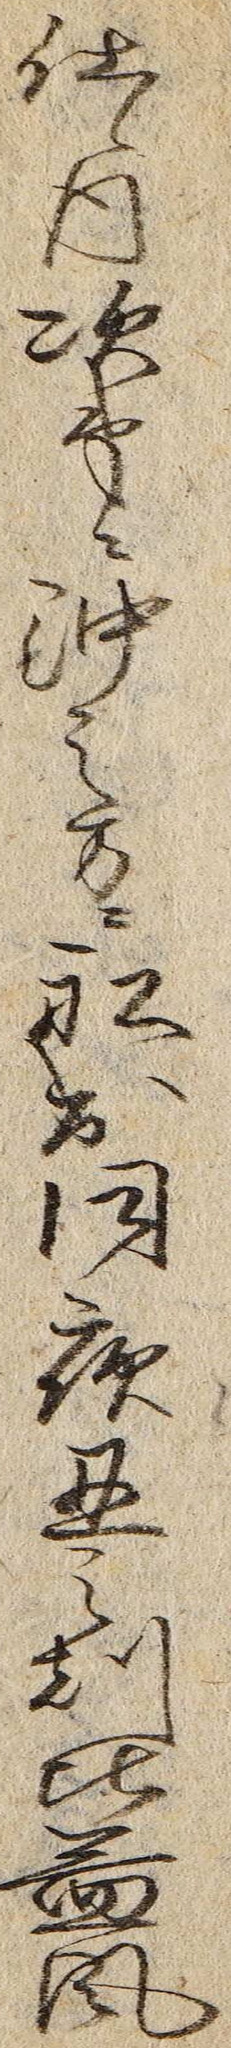仕候内次第に沖の方に船出同夜丑の刻頃益風
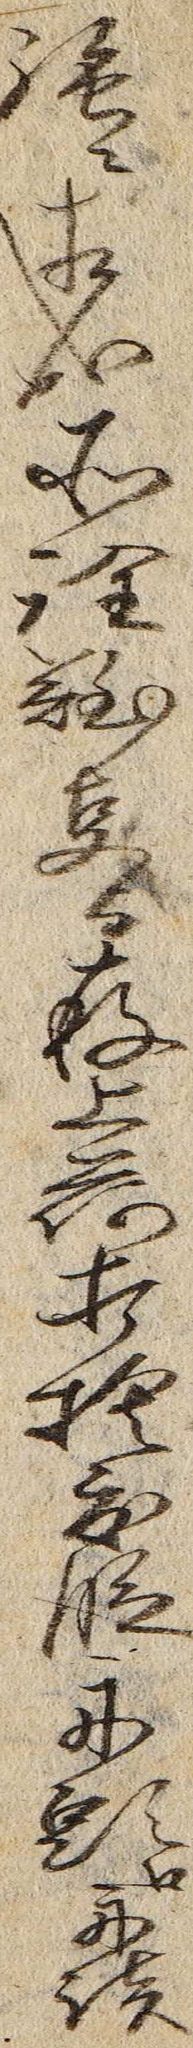強に相成所詮難事と存上荷打捨度段船頭へ舟談
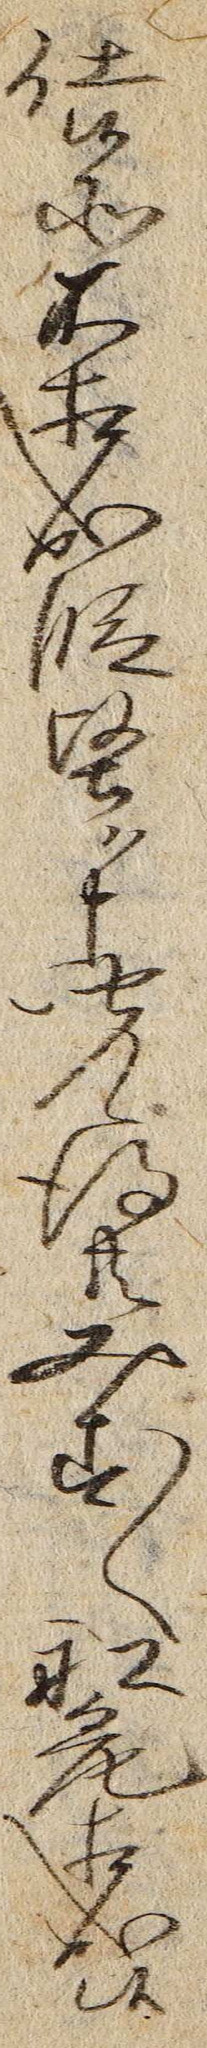仕候所不相成段堅ク申聞候得どもみすみす船危相成候
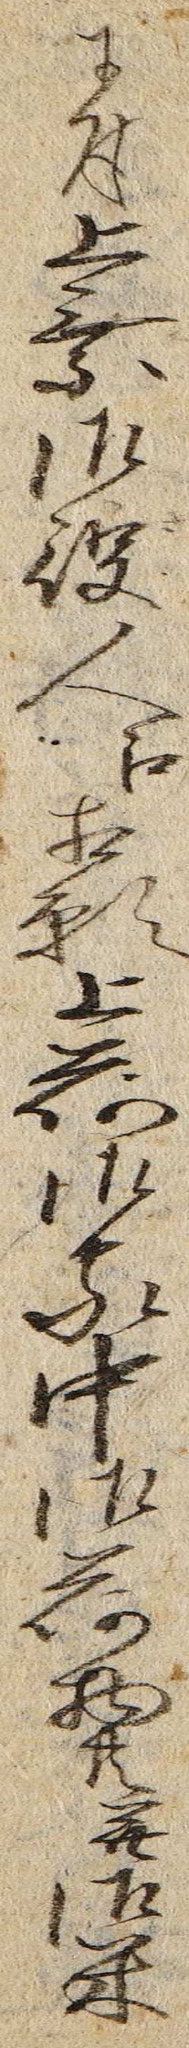に付上乗御役人へ相願上荷御家中御荷物共并御米
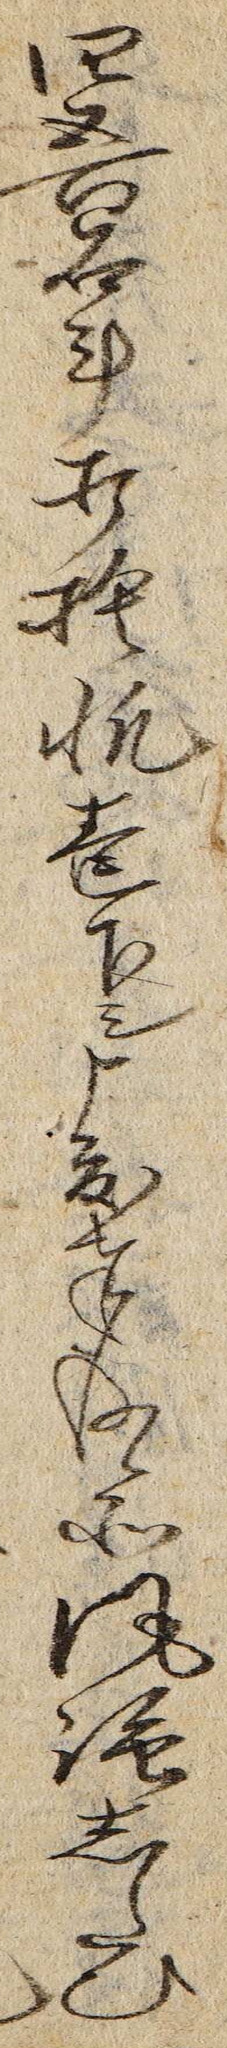四五百石斗打捨帆巻下申度奉存候所風強したひ
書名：能登国清兵衛異国江漂流之始末
